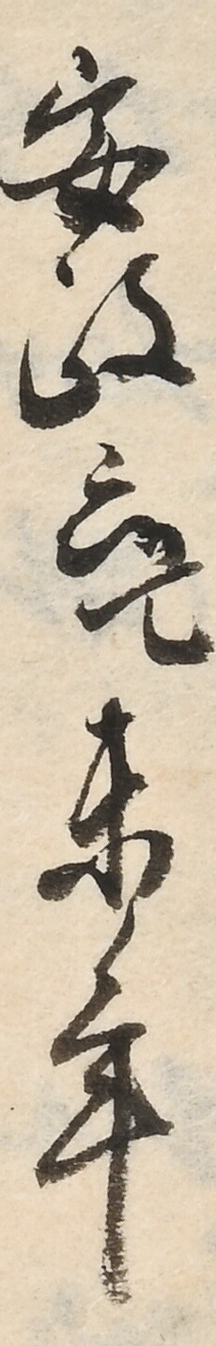安政六己未年
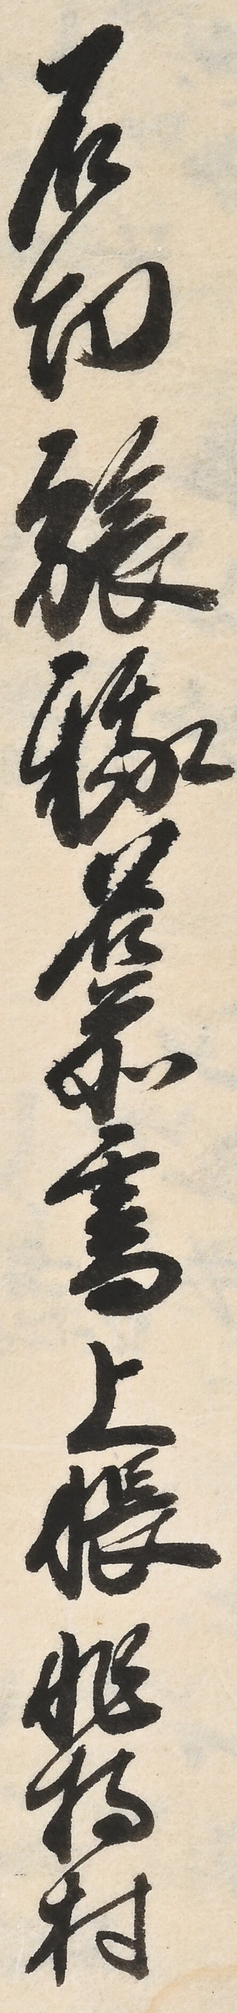石切旅稼名前書上帳非持村

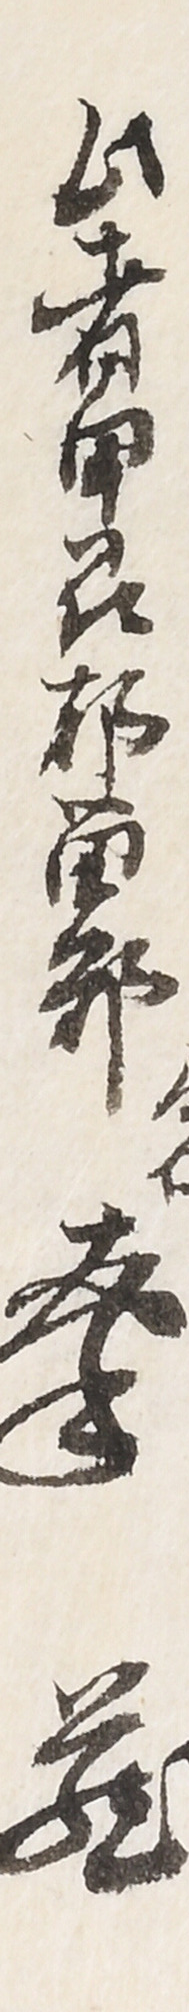此者甲州都留郡宿幸蔵
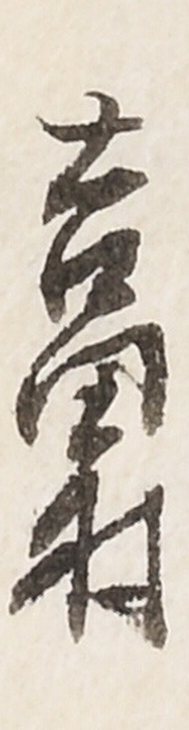吉田村
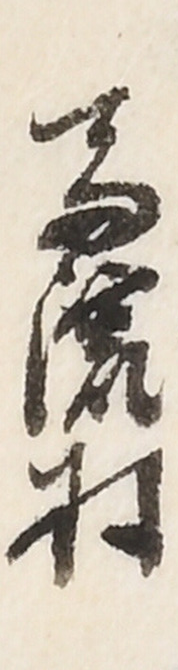馬流村
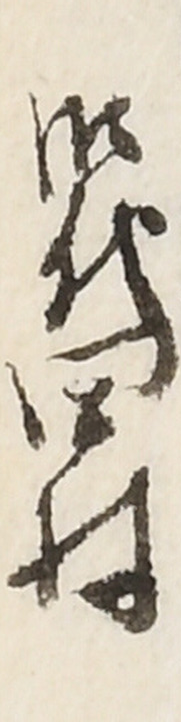御代田村
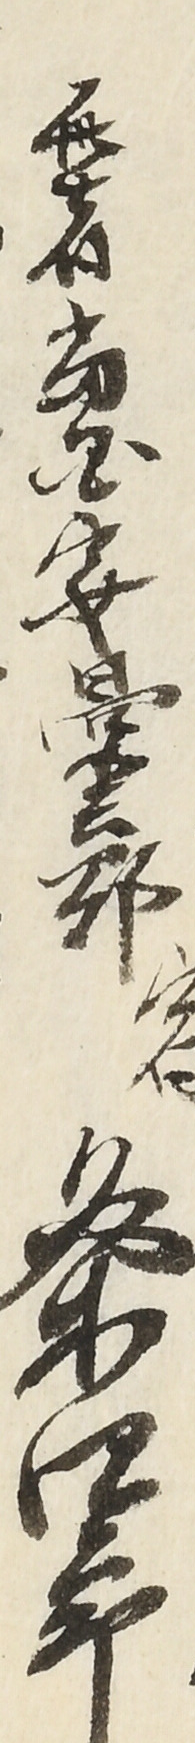此者当国安曇郡宿粂四郎
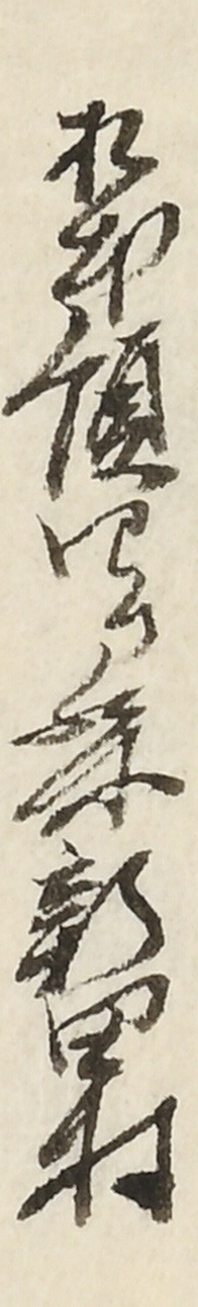松本領四ヶ条新田村

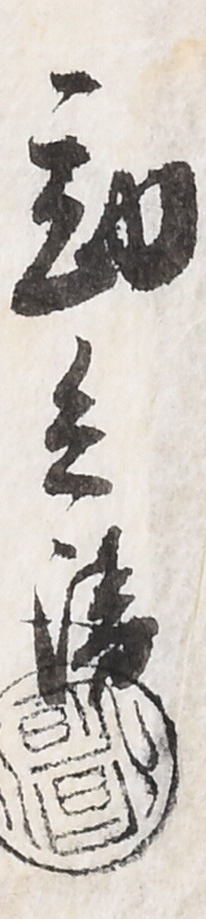勘兵衛㊞
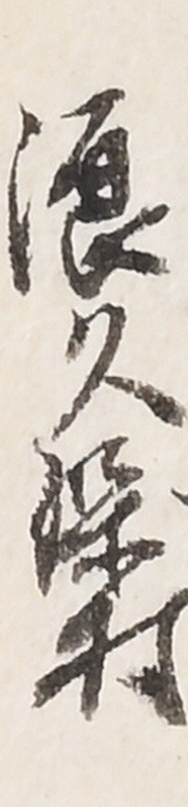浪久保村
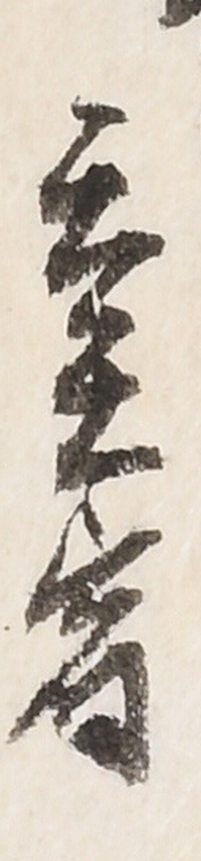天王宿
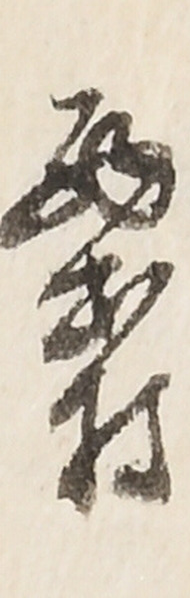西出村
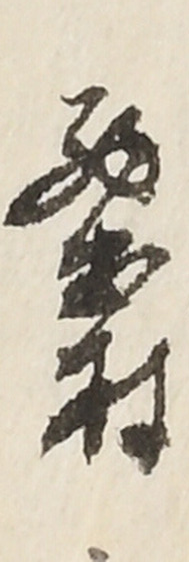西出村

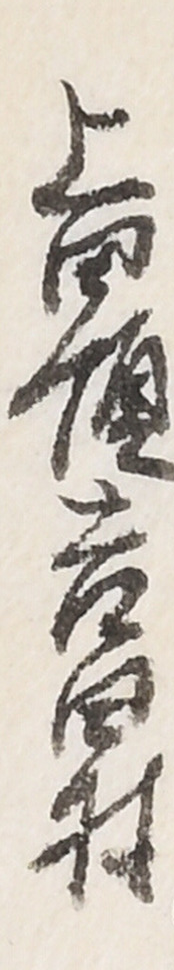上田領吉田村
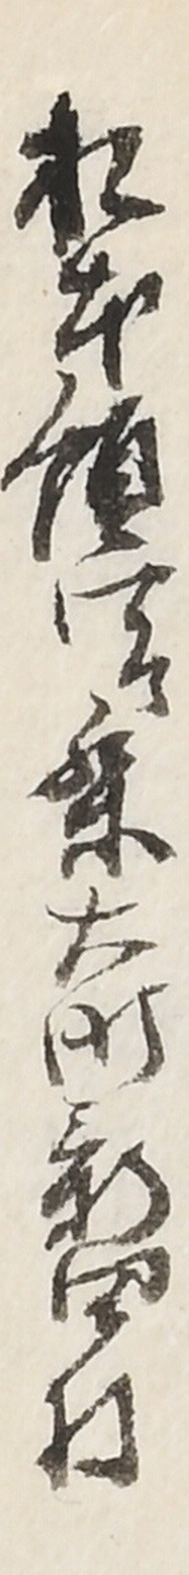松本領四ヶ乗大町新田村
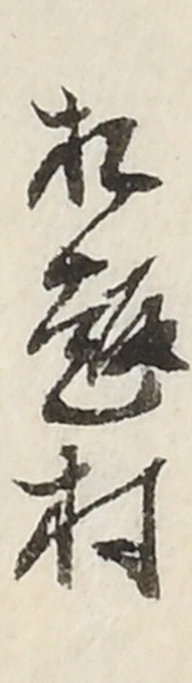松越村
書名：安政六己未年二月石切旅稼名前書上帳
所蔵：伊那市立高遠町図書館・合同会社AMANE
